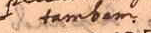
tambem
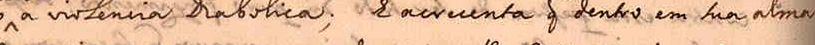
a violencia Diabolica; E acrecenta q̄ dentro em sua alma
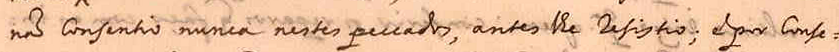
naõ consentio nunca nestes peccados, antes lhe Resistio; e por conse
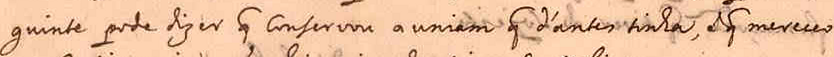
guinte pode dizer q̄ conservou a uniam q̄ d'antes tinha, e q̄ mereceo
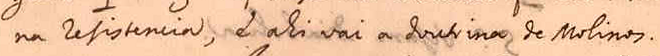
na resistencia, e ahi vai a doutrina de Molinos.
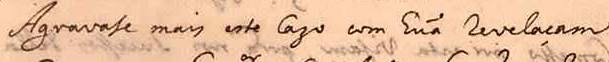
Agravase mais este Cazo com hua Revelaçam
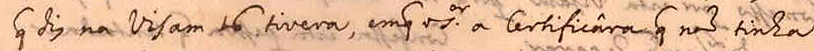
q̄ diz na Visam 16 tivera, em q̄ o s.or a Certificâra q̄ naõ tinha
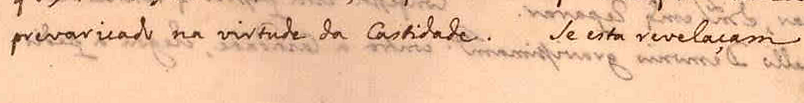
prevaricado na virtude da Castidade. Se esta revelaçam
